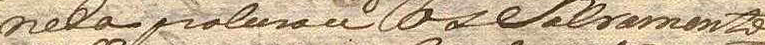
nella procurou oz Sacramentoz
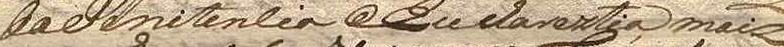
da Penitencia e Euchareztia, maiz
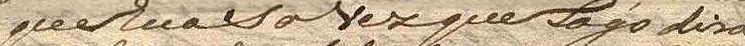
que hua So Vez que Logo dira
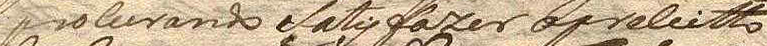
procurando satisfazer o preceitto
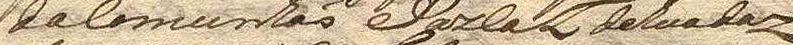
da Comunhaõ PazcaL de hua daz
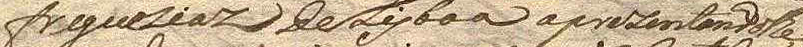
fregueziaz de Lisboa aprezentandolhe
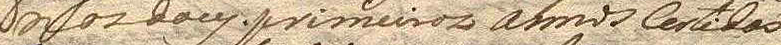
nos dous primeiroz annos certidaõ
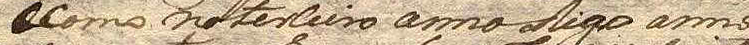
e como no terceiro anno digo anno
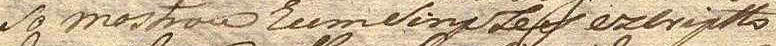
so mostrou hum sinples ezcriptto
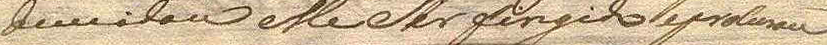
duuidou elle Ser fingido e procurou
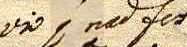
vio q̄ naõ fez
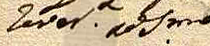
Rever.a ao S.mo
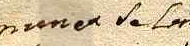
nunca se Con
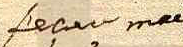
feçou mais
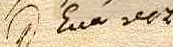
q̄ huā vez
